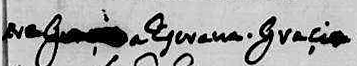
a Escraua. Gracia.
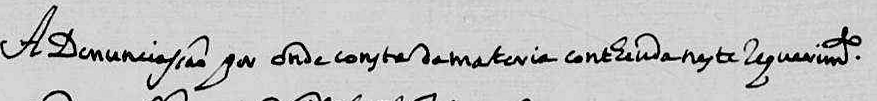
A Denunciassaõ por onde consta da materia contheuda neste Requerimto.
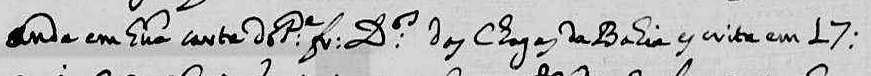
anda em huā carta do P:e fr: D:os das Chagas da Bahia escrita em 17:
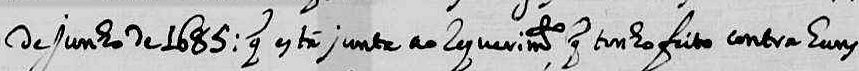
de junho de 1685: q̄ está junta ao Requerimto, q̄ tenho feito contra huns
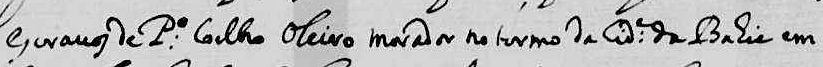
escrauos de P:o Coelho Oleiro morador no termo da Cid:e da Bahia em
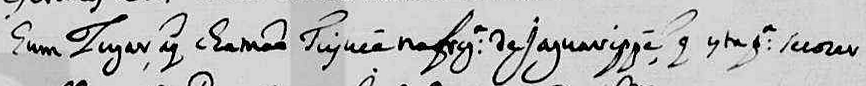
hum Lugar, a q̄ chamão Tujucá na freg:a de Jaguarippé, q̄ esta p:a se cazar
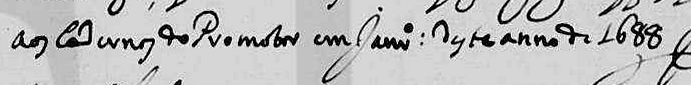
aos Cadernos do Promotor em Janro: deste anno de 1688
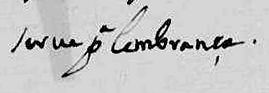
serue pa lembrança.
